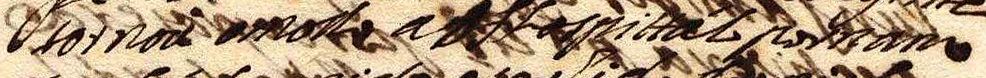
tornou o mosso ao HospittaL por nam
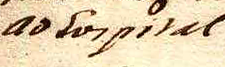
ao hospital
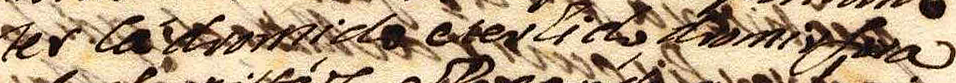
ter cá dromido e ter hido dromir fora
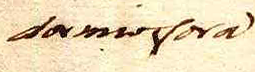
dormio fora
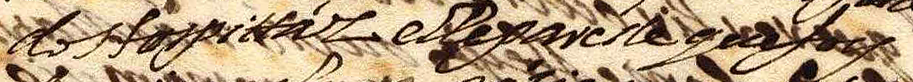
do HospittáL e lhe paresse que foy
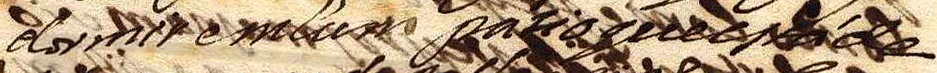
dormir em hum patio que está de
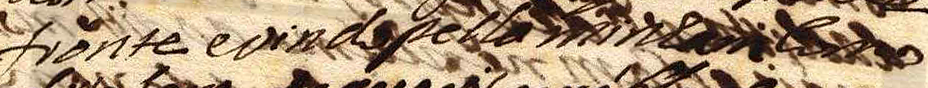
fronte e vindo pella minham Como
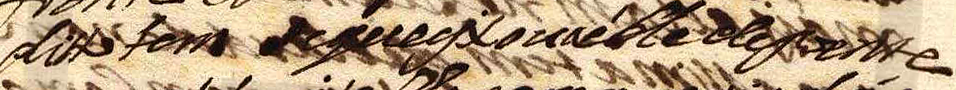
ditto tem se queyxou a elle depoente
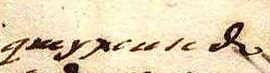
queyxouse do
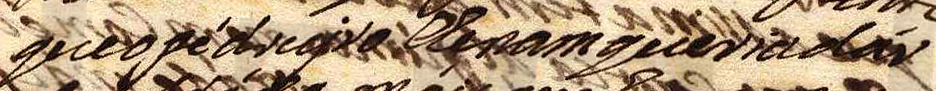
que o pedreyro lhe nam queria dár
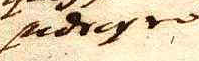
pedreyro
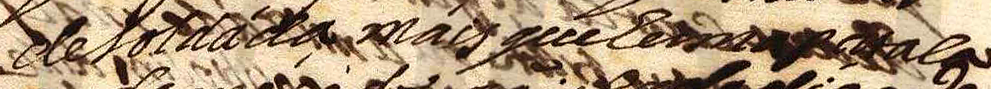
de soldáda máis que huma pataca
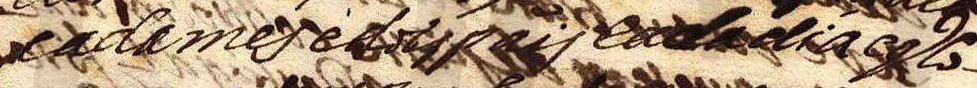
cada mes e despois cada dia e q̄ co
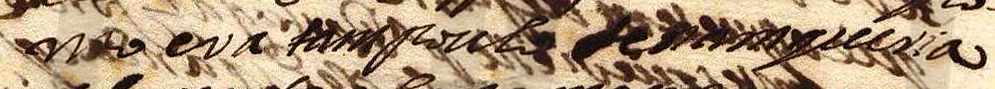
mo era tam pouco se nam queria
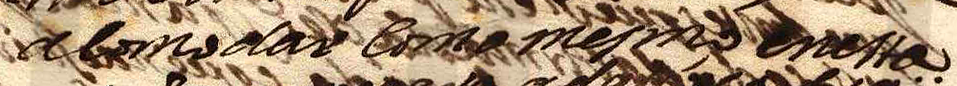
acomodar com o mesmo e nesta
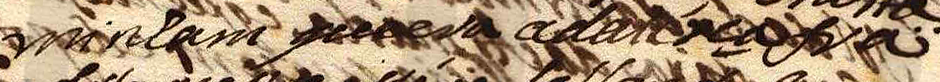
minham que era a da terça fra
